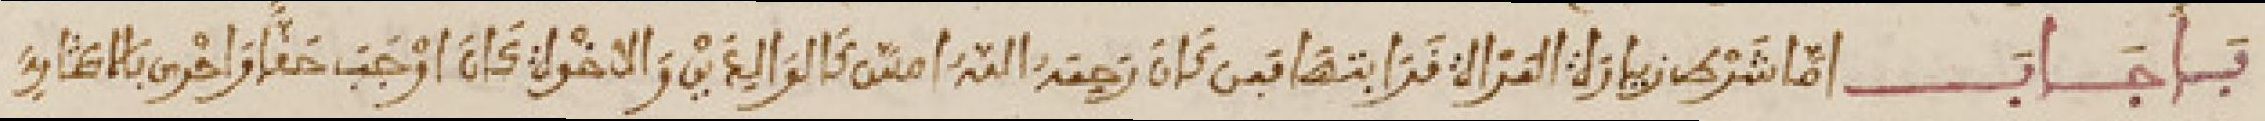فأجاب اما شرط زيارة المراة قرابتها فمن كان رحمه الله امس كالوالدين والاخوة كان اوجب حقا واحرى بالاكثار
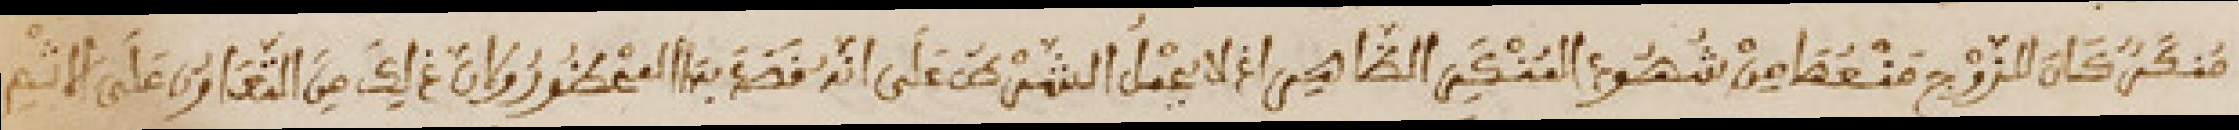منكر كان للزوج منعها من شهود المنكر الظاهر اذ لا يحتمل الشرط على انه قصد بها المحظور ولان ذلك من التعاون على الاثم
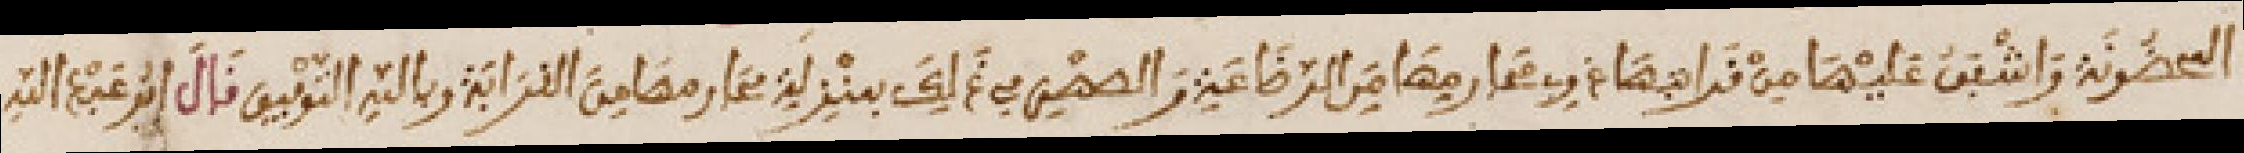المحضونة واشفق عليها من قرابتها ذوي محارمها من الرضاعة والصهر في ذلك بمنزلة محارمها من القرابة وبالله التوفيق قال ابو عبد الله
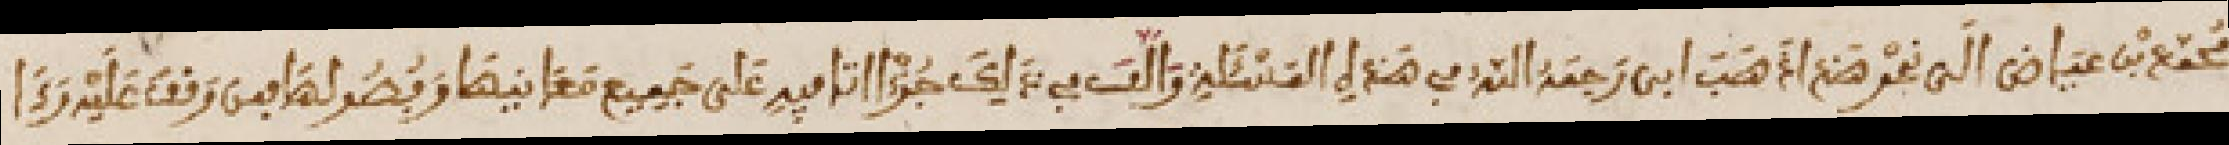محمد بن عياض الى نحو هذا ذهب ابي رحمه الله في هذه المسئلة والف في ذلك جزءا اتا فيه على جميع معانيها وفصولها فمن وقف عليه رءا
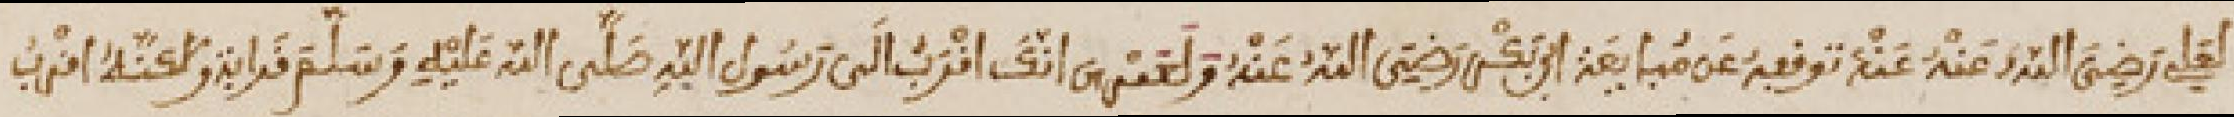لعلي رضي الله عنه عند توقفه عن مبايعة ابي بكر رضي الله عنه ولعمري انك اقرب الى رسول الله صلى الله عليه وسلم قرابة ولاكنه اقرب
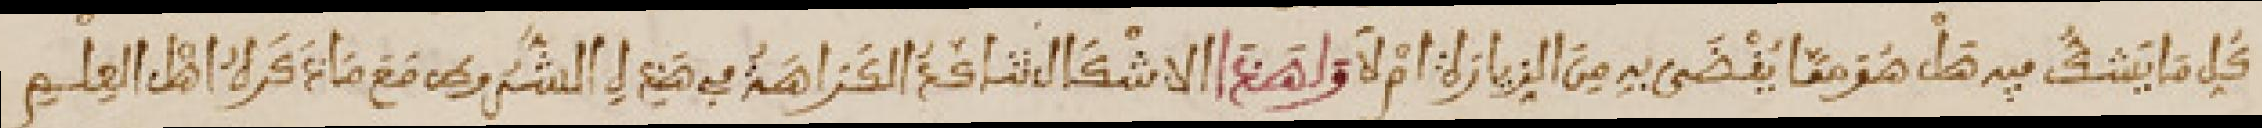كل ما يشك فيه هل هو مما يقضى به من الزيارة ام لا ولهذا الاشكال تتاكد الكراهة في هذه الشروط مع ما ذكره اهل العلم
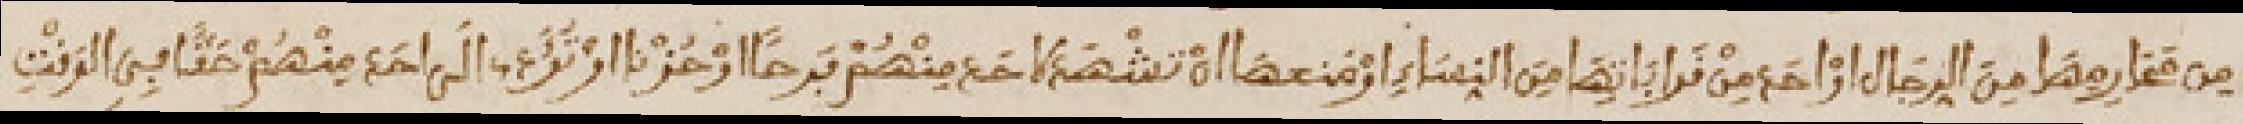من محارمها من الرجال او احد من قراباتها من النساء او منعها ان تشهد لاحد منهم فرحا او حزنا او تؤدي الى احد منهم حقا في الوقت
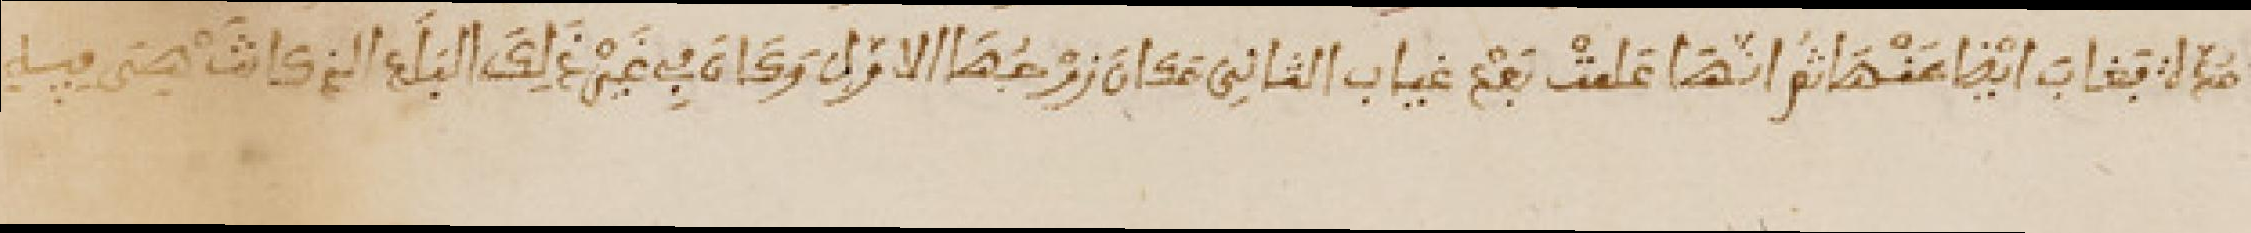مدة فغاب ايضا عنها ثم انها علمت بعد غياب الثاني مكان زوجها الاول وكان في غير ذلك البلد الذي كانت هي فيه
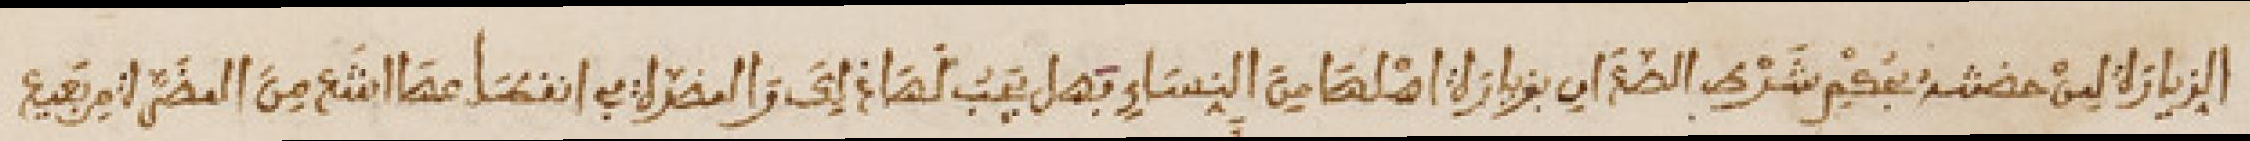الزيارة لمن حضنته بحكم شرط الصداق بزيارة اهلها من النساء فهل يجب لها ذلك والمضرة في انقطاعها اشد من المضرة من بعيد
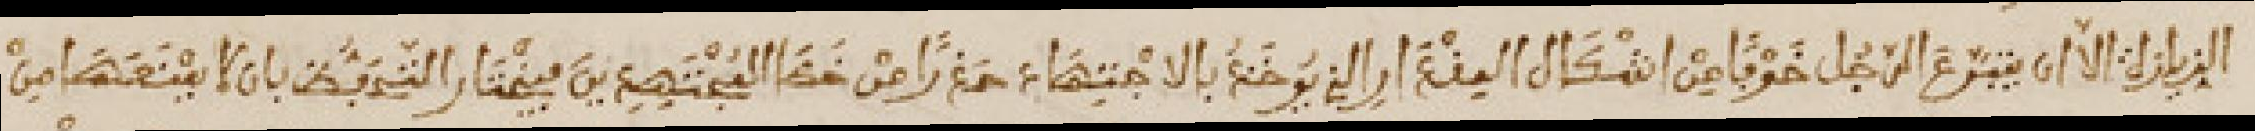الزيارة الا ان يتبرع الرجل خوفا من اشكال المقدار الذي يوخذ بالاجتهاد حذرا من خطا المجتهدين فيختار التحفظ بان لا يمنعها من
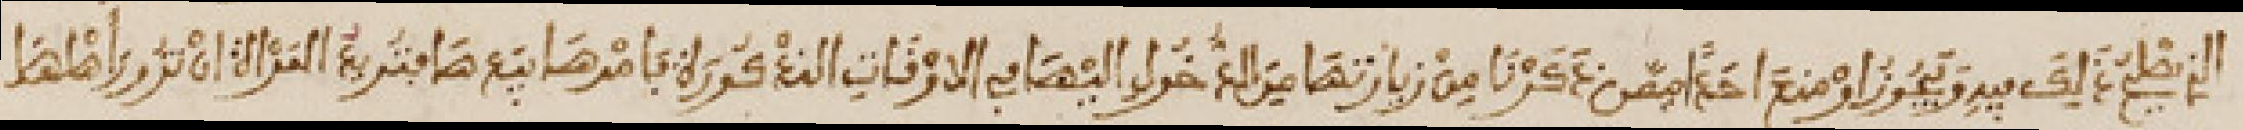الذي يصلح ذلك فيه ويجوز او منع احدا ممن ذكرنا من زيارتها من الدخول اليها في الاوقات المذكورة فامرها بيدها فتريد المراة ان تزور أهلها
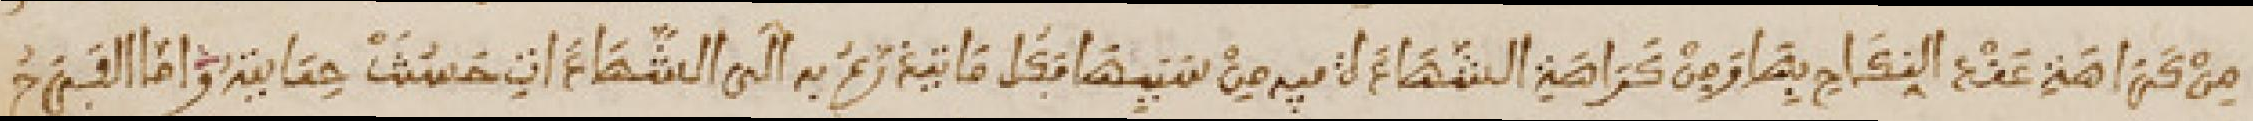من كراهة عقد النكاح بها ومن كراهة الشهادة فيه من سببها فكل ما يتذرع به الى الشهادات حسنت حمايته واما الفرح
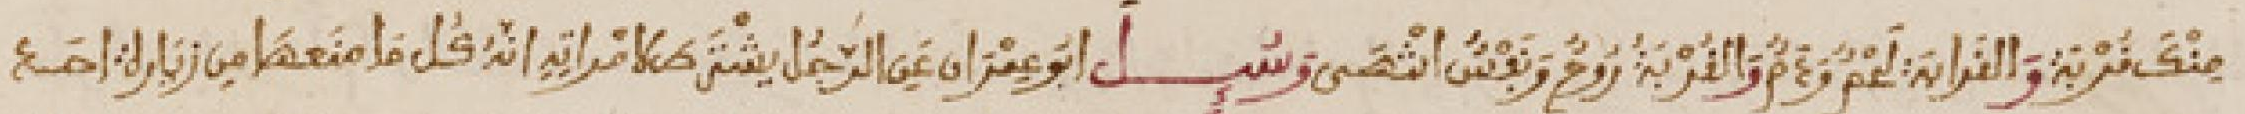منك قربة والقرابة لحم ودم والقربة روح ونفس انتهى وسئل ابو عمران عن الرجل يشترط لامراته انه كل ما منعها من زيارة احد
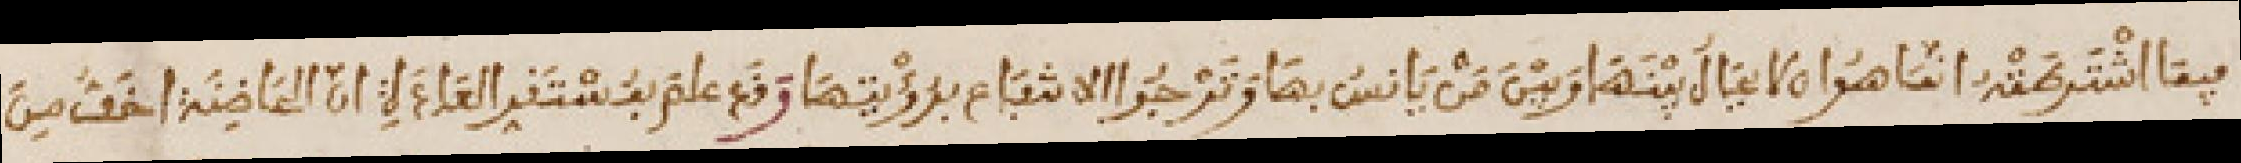فيما اشترطته انما هو ان لا يحال بينها وبين من يانس بها وترجو الانتفاع برؤيتها وقد علم بمستقر العادة ان الحاضنة احق من
